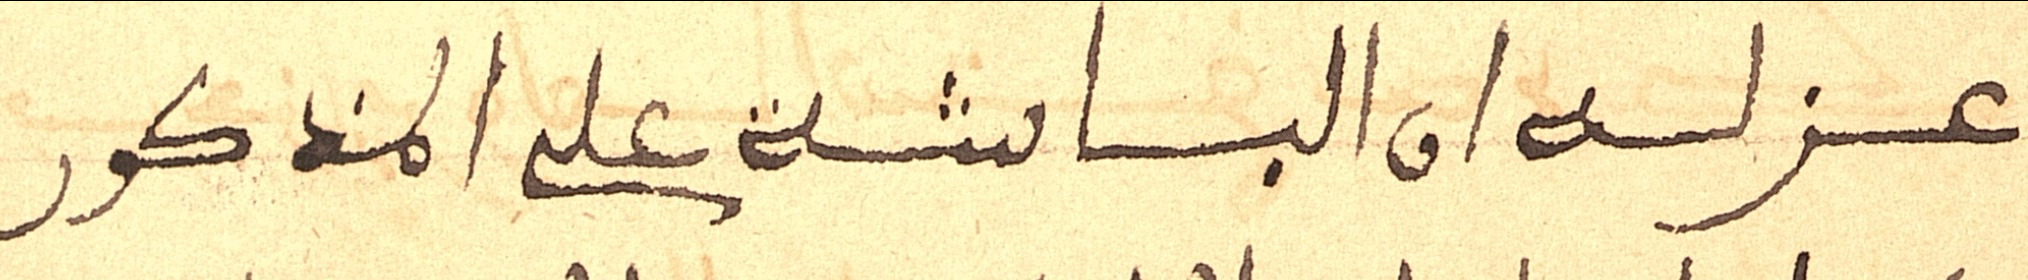عزله ان الباشة على المذكور
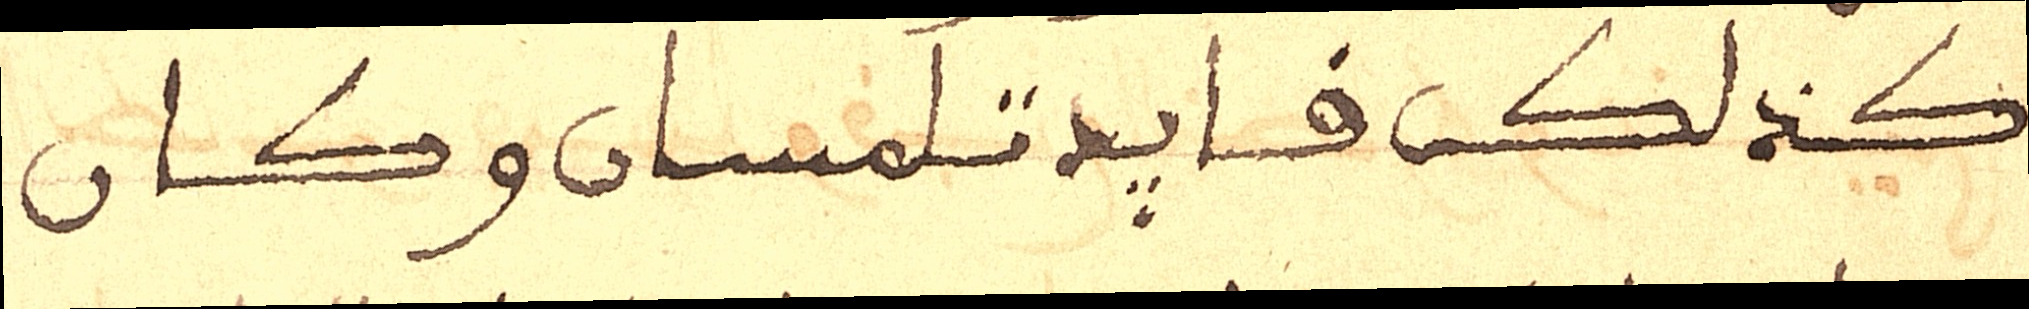كذلك قائد تلمسان وكان
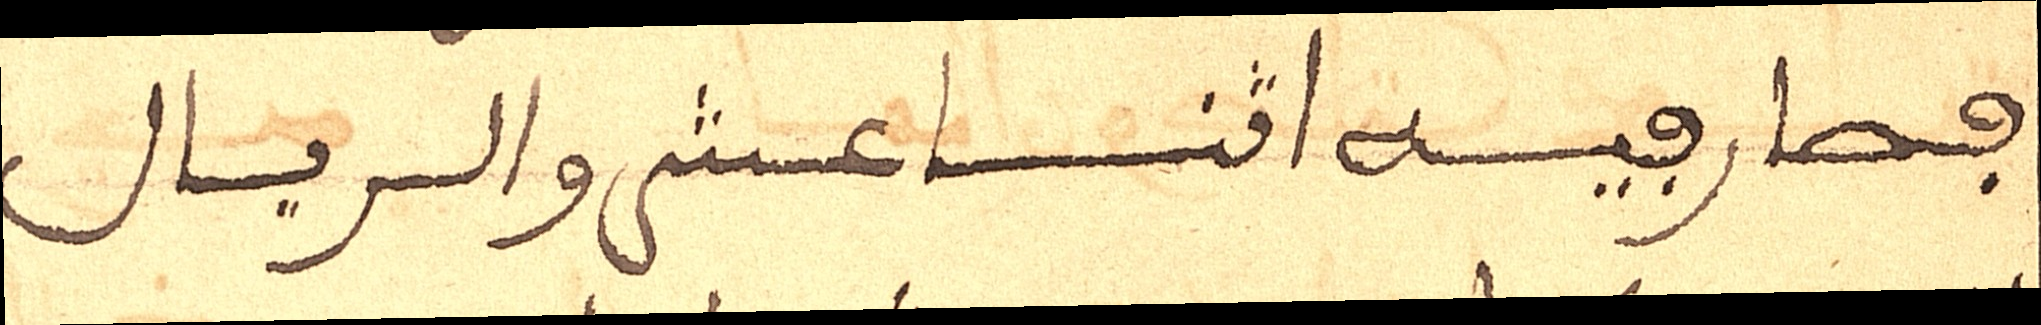فصار فيه اثنا عشر والريال
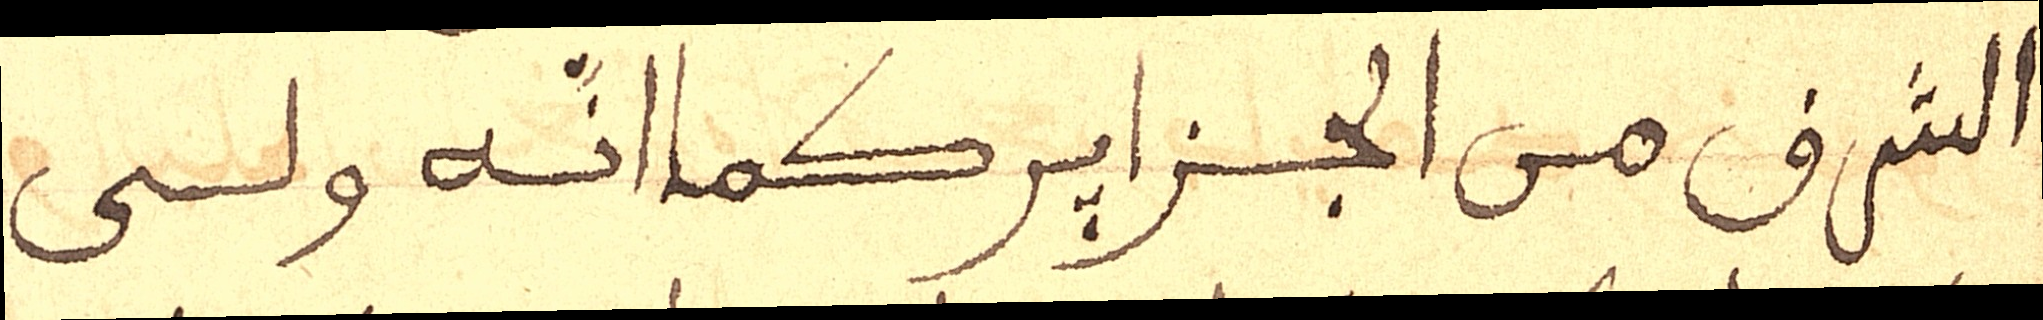الشرق من الجزائر كما انه ولى
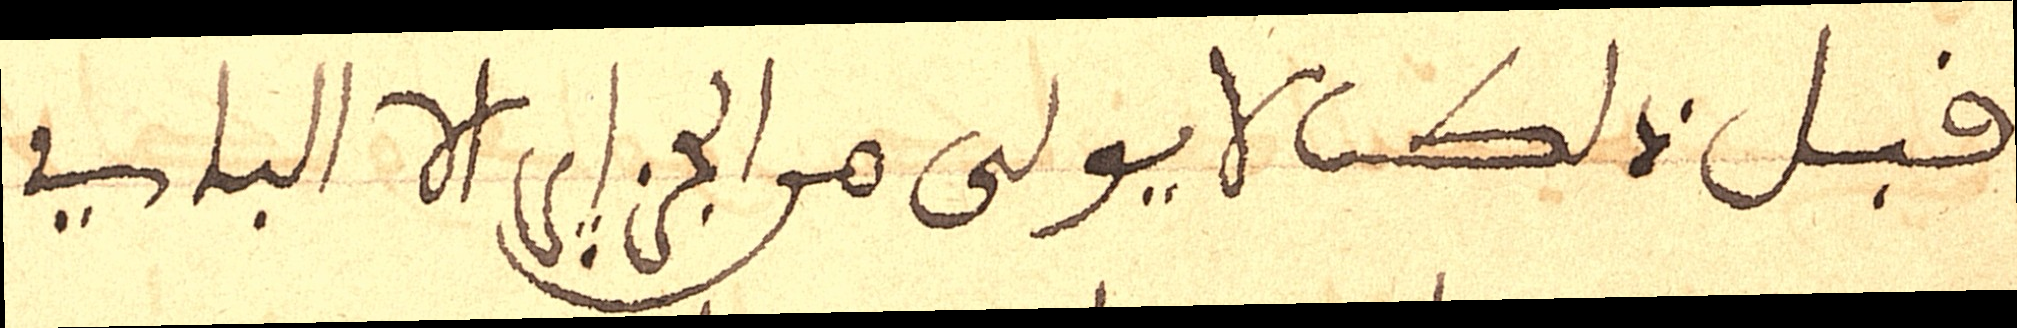قبل ذلك لايولى من الجزائر الا الباي
